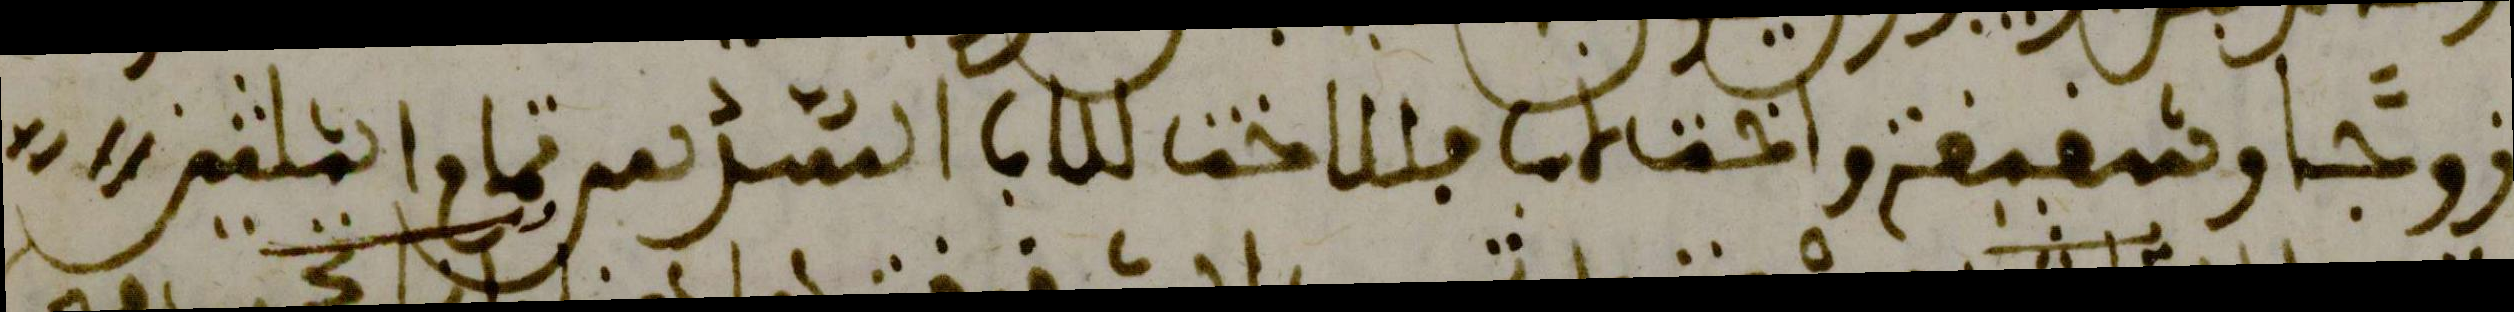زوجًا وشقيقة واخت لاب فللاخت للاب السّدس تمام الثلثين
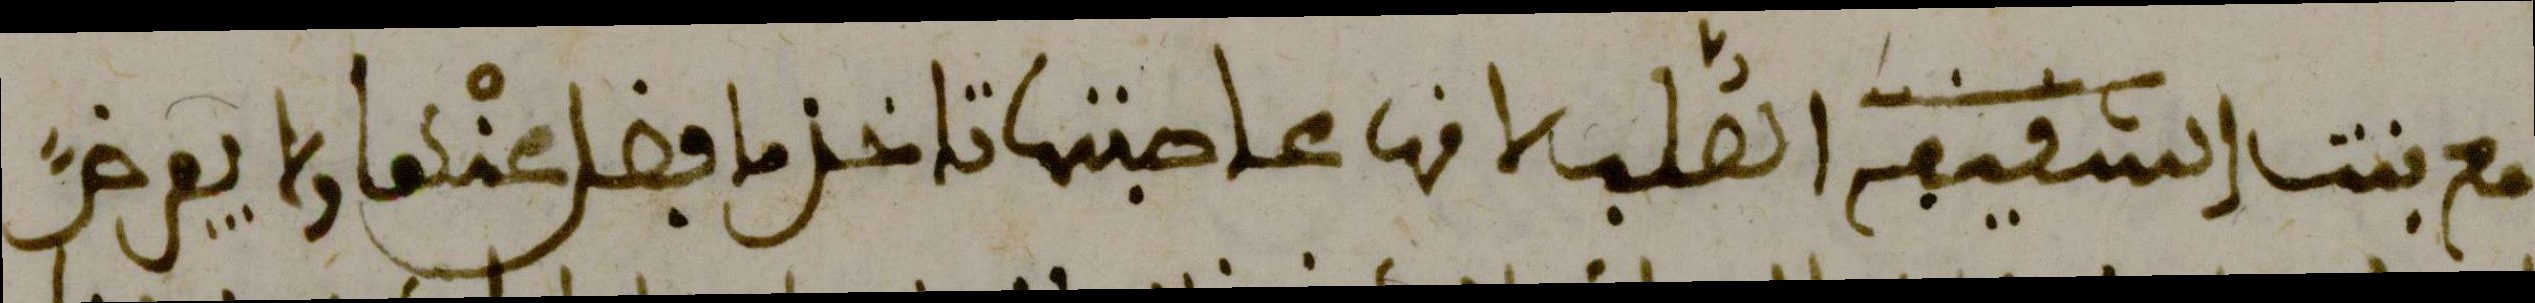مع بنت الشقيقة الصّلب لانها عاصبتها تاخذ ما فضل عنْها ولا يفرض
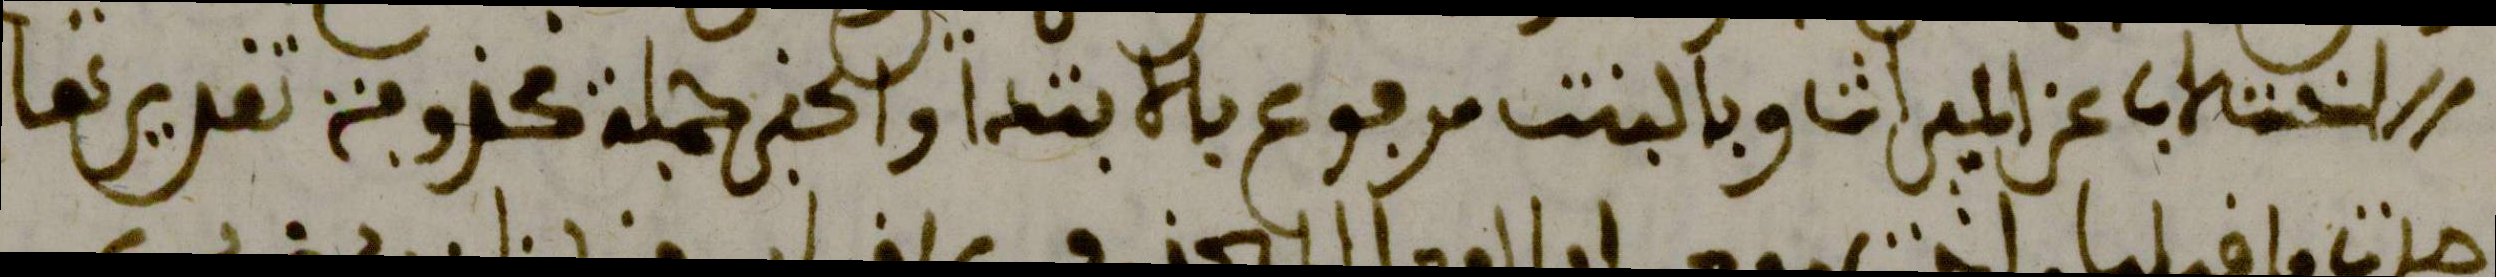الاخت لاب عن الميراث وبالبنت مرفوع بالابتدا والخبر جملة محذوفة تقديرها
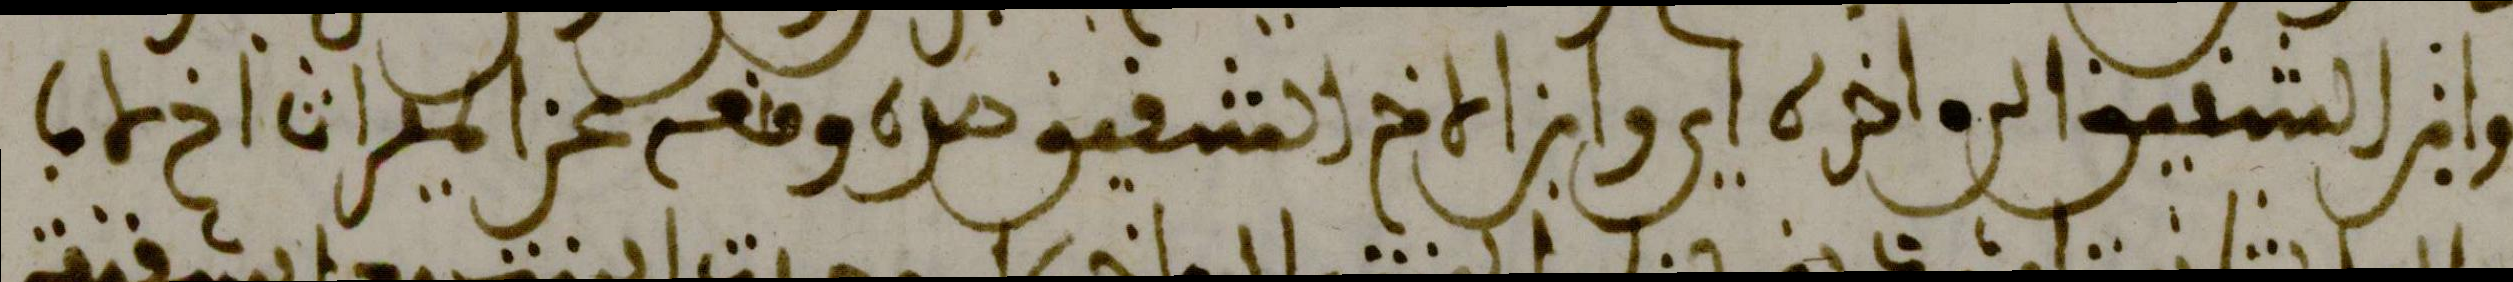وابن الشقيق الى ءاخره اي وابن الاخ الشقيق صده ومنعه عن الميراث اخ لاب
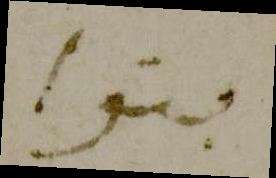بنوا
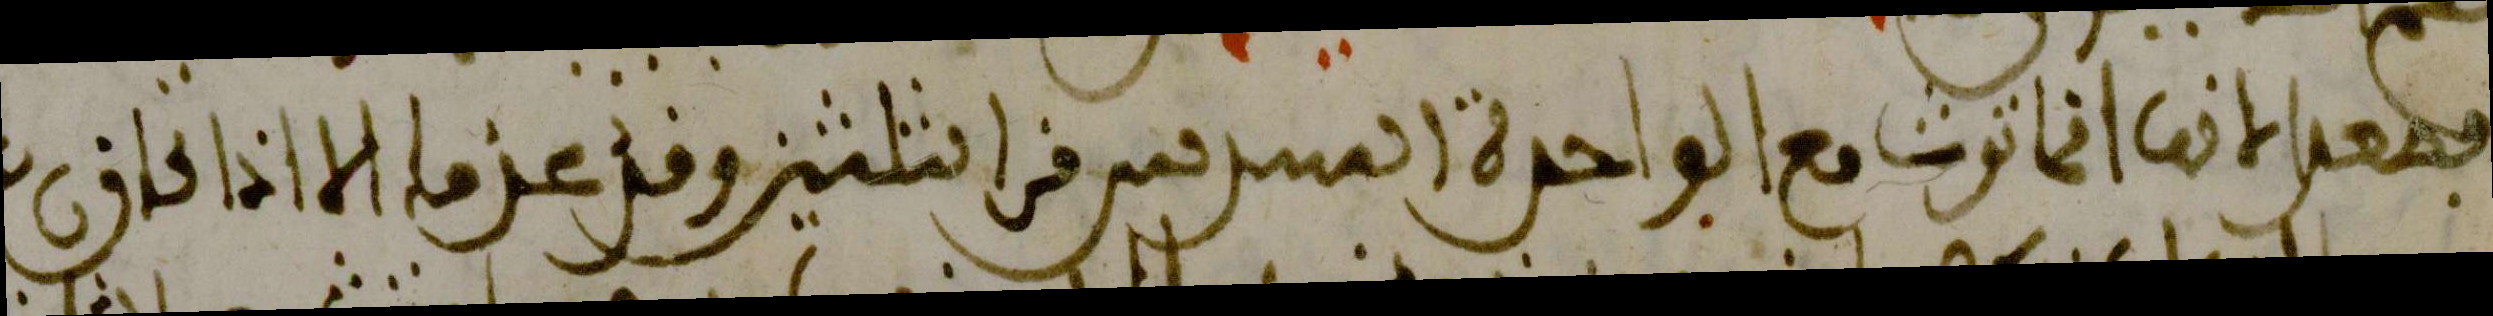فصعدا لانها انما ترث مع الواحدة السدس من الثلثين وقد عدما الا اذا كان
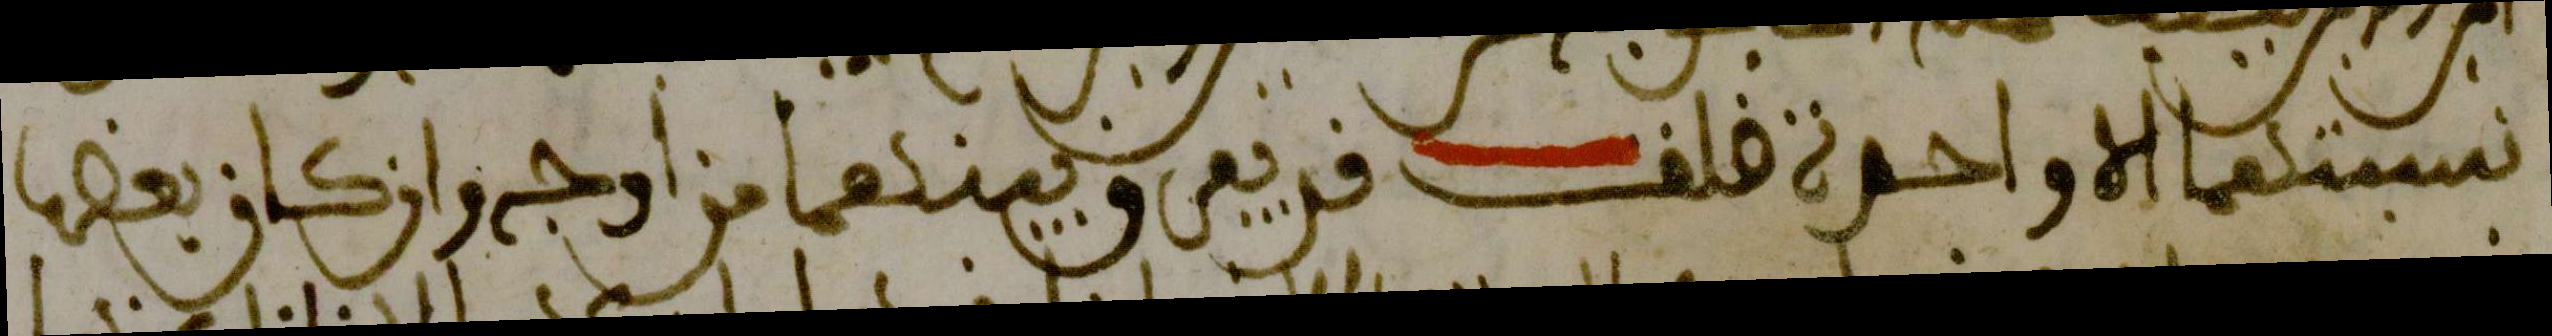نسبتهما الا واحدة قلت قد يفرق بينهما من اوجه وان كان بعضها
